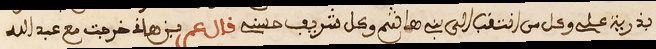بذرية على وكل من انتقب الى بنى هاشم وكل شريف حسنى قال عمر بن هانى خرجت مع عبد الله
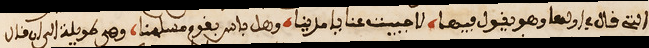التي قال في اولها وهو يقول فيها لاحييت عنا يا مدينا وهل باس بقوم مسلمنا وهي طويلة الى ان قال
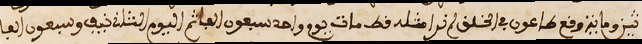ثين وماية وقع طاعون في الخلق لم نرا مثله قط مات يوم واحد سبعون الفا ثم اليوم الثانى نيف وسبعون الفا
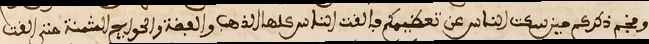وفخر ذكركم حين سكت الناس عن تعظيمكم فالقت الناس كلها الذهب والفضة والحوايع المثمنة حتى القت
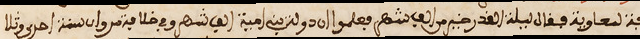فة لمعاوية فقال ليلة القدر خير من الف شهر فعلموا ان دولة بنى امية الف شهر وفي خلافة مروان سنة احد وثلا
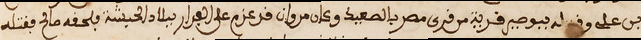بن على وقتله ببوصير قرية من قرى مصر بالصعيد وكان مروان قد عزم على الفرار ببلاد الحبسة فلحقه صالح فقتله
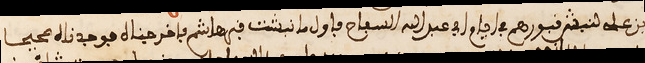بن على لنبش قبورهم في ايام ابي عبد الله السفاح فاول ما نبشت قبرهاشم فاخرجناه فوجدناه صحيحا
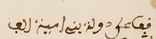قف على دولة بنى امية لف
